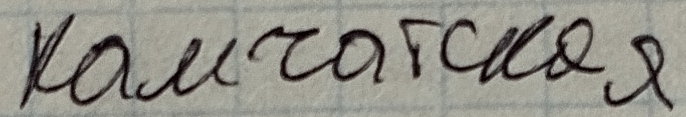камчатская
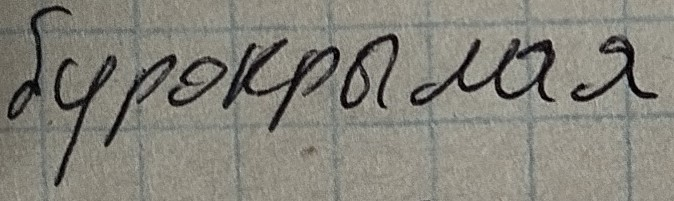бурокрылая
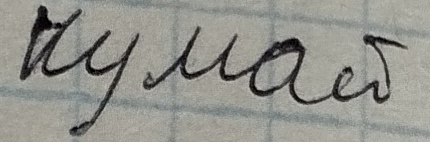кумай
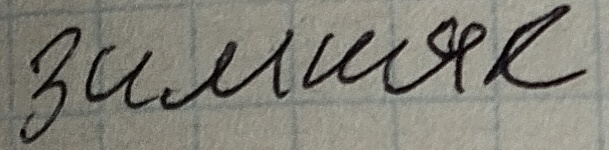зимняк
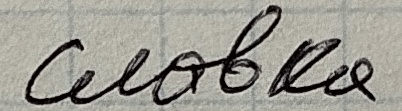славка
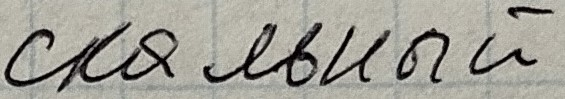скальный
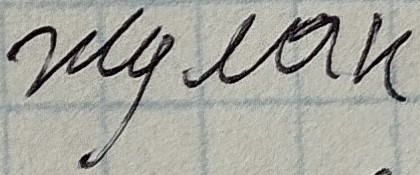жулан
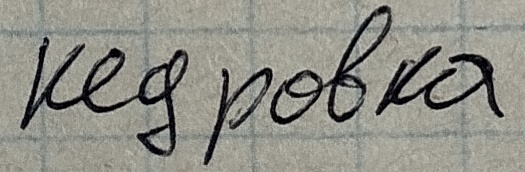кедровка
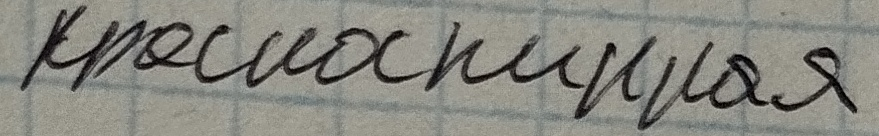красноспинная
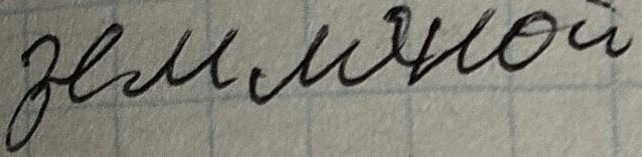земляной
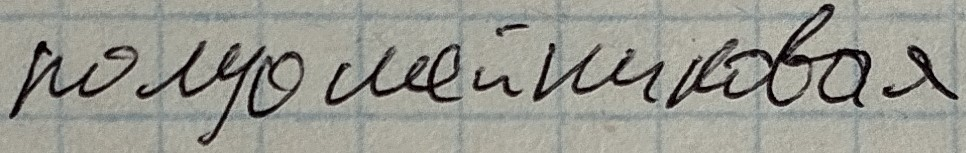полуошейниковая
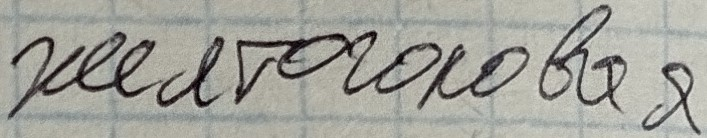желтоголовая
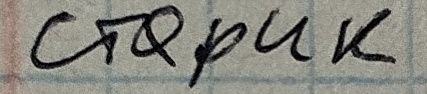старик
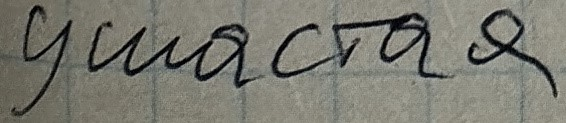ушастая
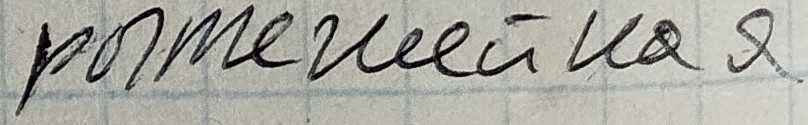рыжешейная
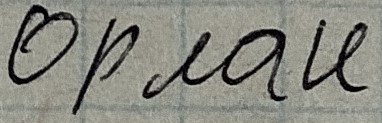орлан
